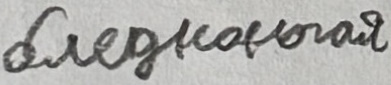бледноногая
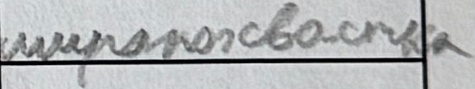широкохвостка
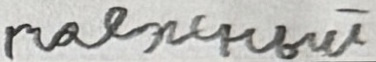таежный
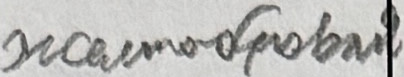желтобровая
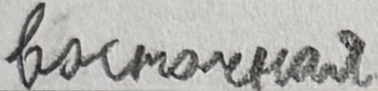восточная
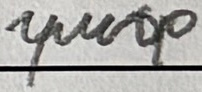гриф
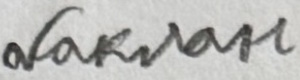баклан
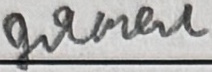дятел
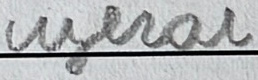щегол
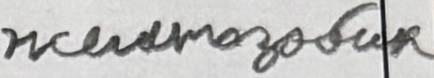желтозобик
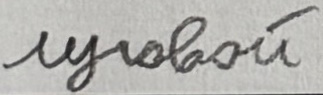луговой
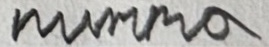питта
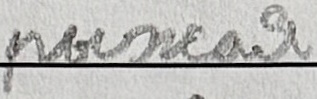рыжая
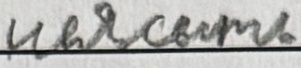неясыть
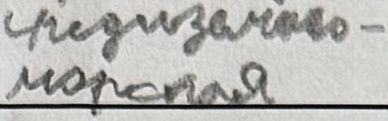средиземно-морская
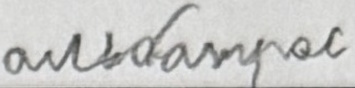альбатрос
